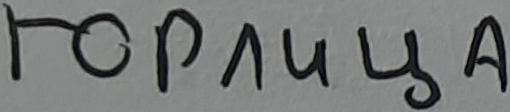горлица
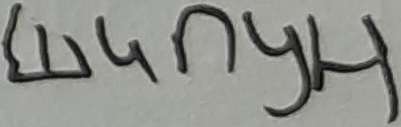шипун
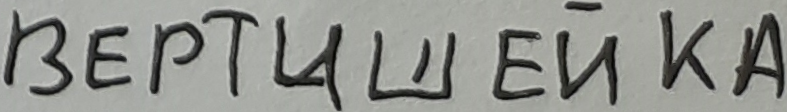вертишейка
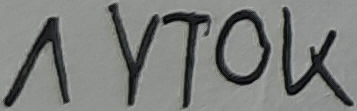луток
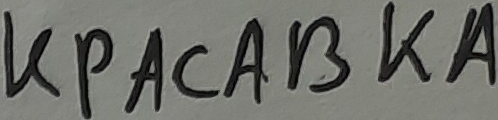красавка
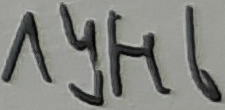лунь
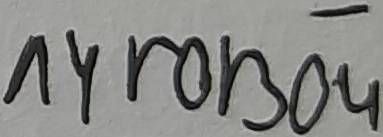луговой
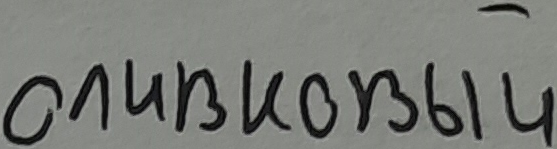оливковый
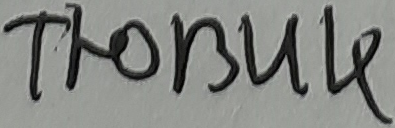тювик
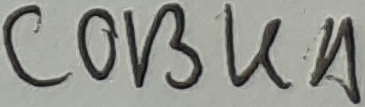совка
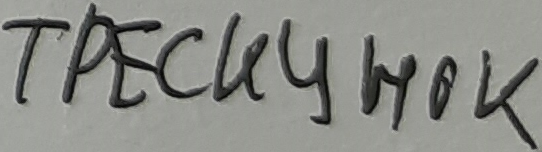трескунок
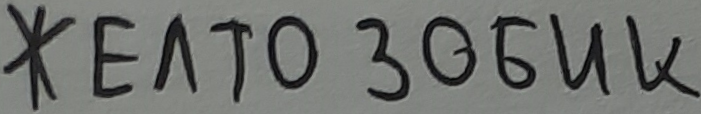желтозобик
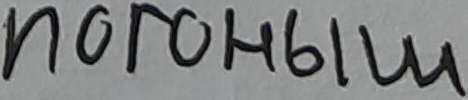погоныш
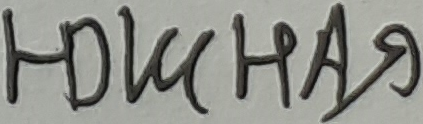южная
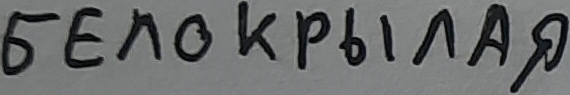белокрылая
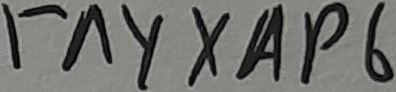глухарь
